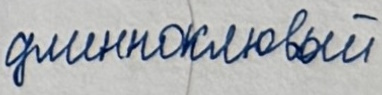длинноклювый
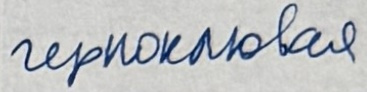черноклювая
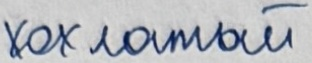хохлатый
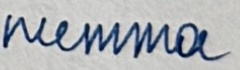питта
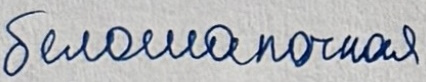белошапочная
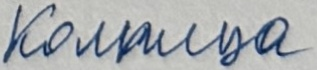колпица
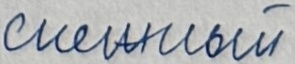снежный
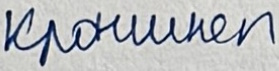кроншнеп
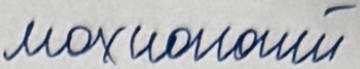мохноногий
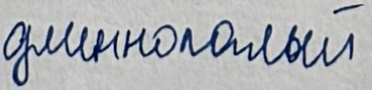длиннолалый
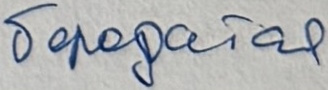бородатая
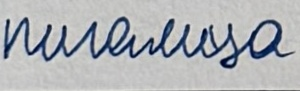пигалица
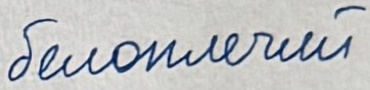белоплечий
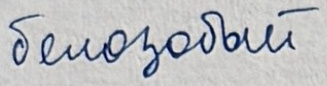белозобый
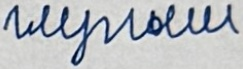глупыш
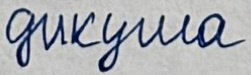дикуша
